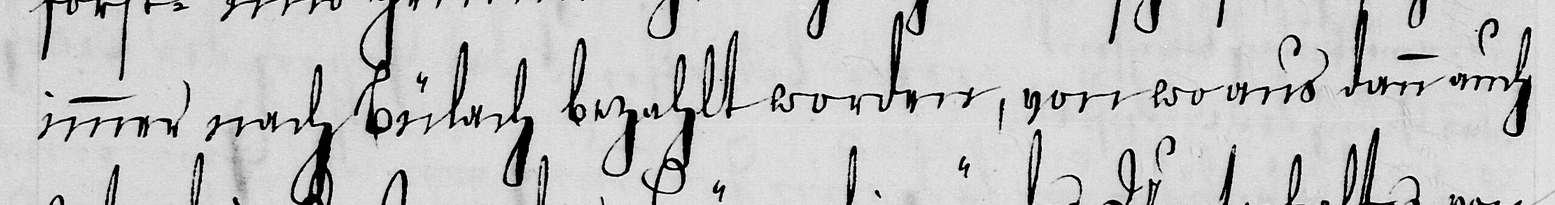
immer nach Bülach bezahlt worden, von wo aus dann auch
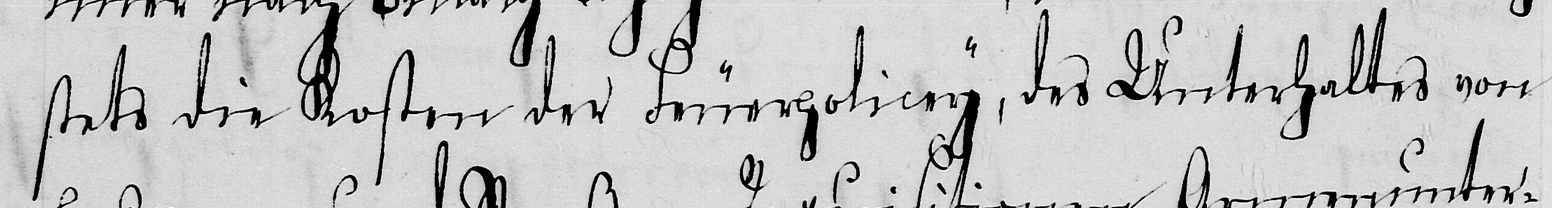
stets die Kosten der Feuerpolicey, des Unterhaltes von
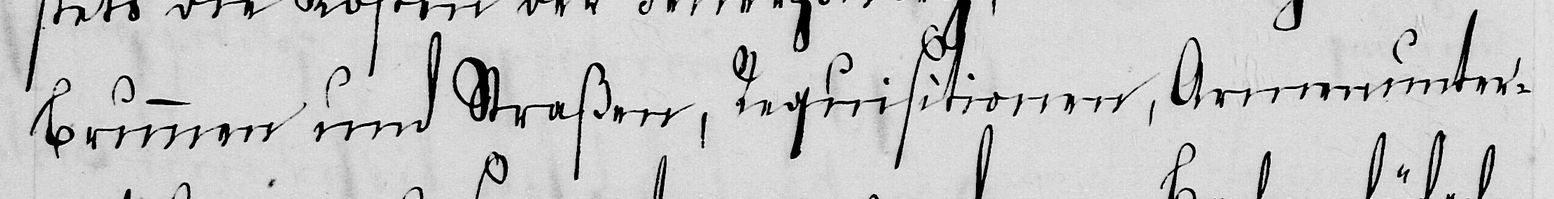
Brunnen und Straßen, Requisitionen, Armenunter¬
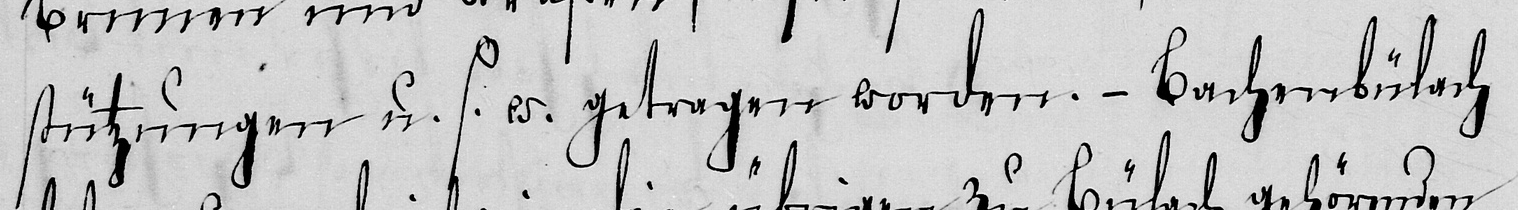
stützungen u. s. w. getragen worden. – Bachenbülach
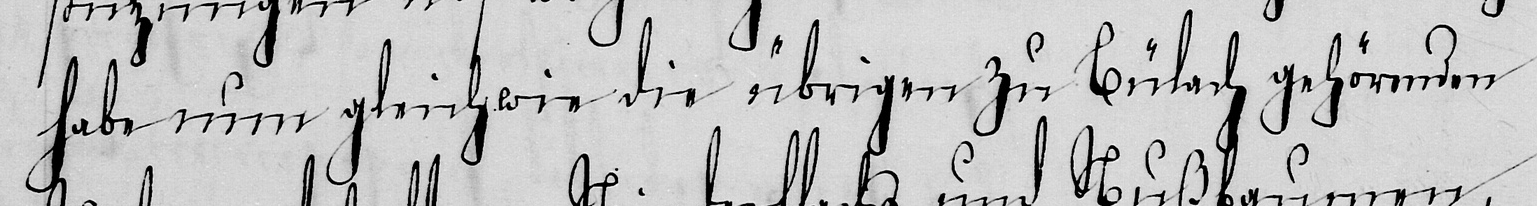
habe nun gleichwie die übrigen zu Bülach gehörenden
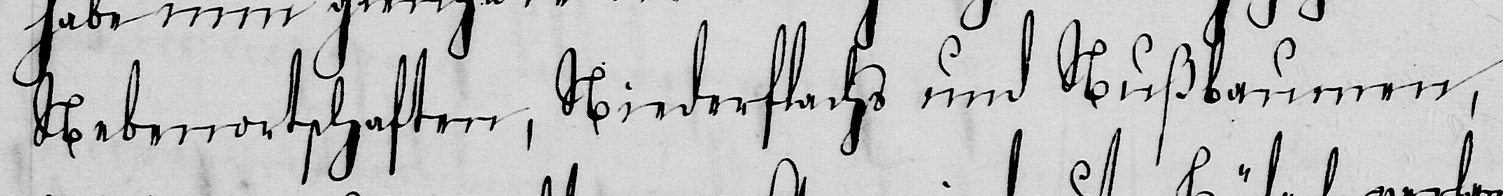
Nebenortschaften, Niederflachs und Nußbaumen,
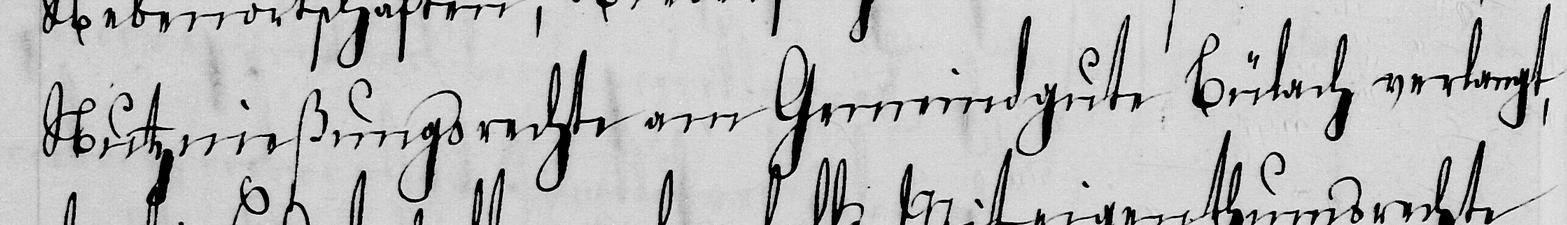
Nutznießungsrechte am Gemeindgute Bülach verlangt,
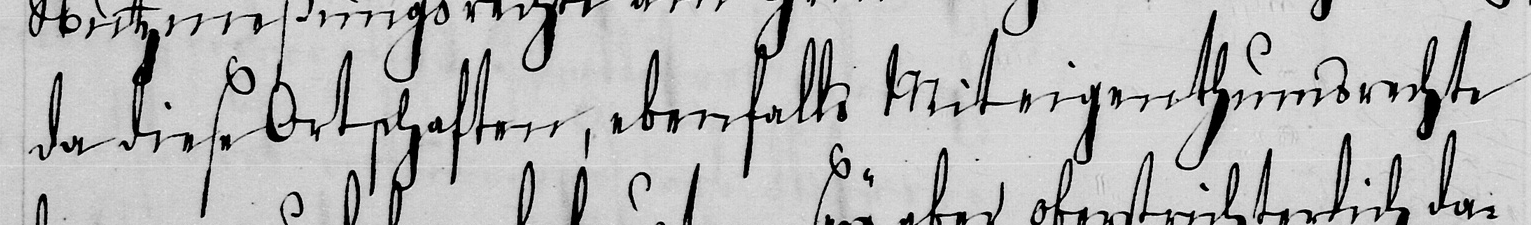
da diese Ortschaften, ebenfalls Miteigenthumsrechte
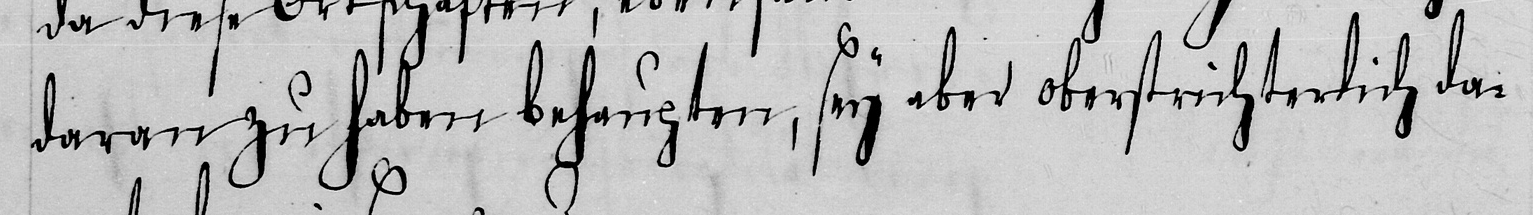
daran zu haben behaupten, sey aber oberstrichterlich d¬
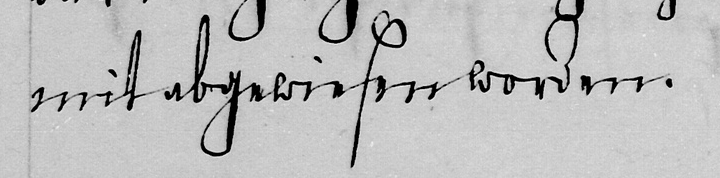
amit abgewiesen worden.
